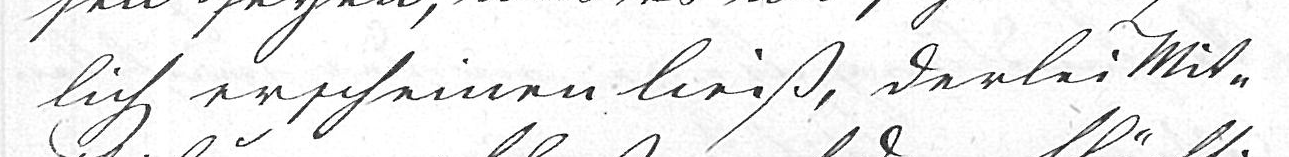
lich erscheinen ließ, derlei Mit-
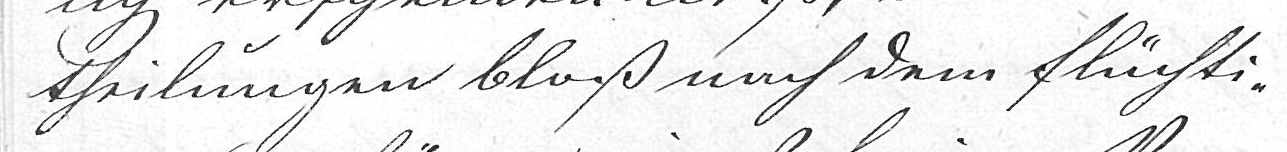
theilungen bloß nach dem flüchti-
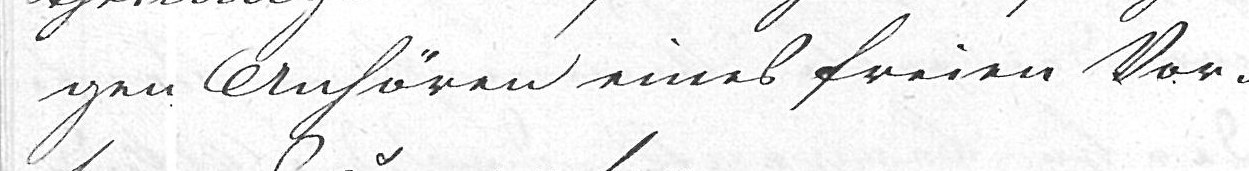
gen Anhören eines freien Vor-
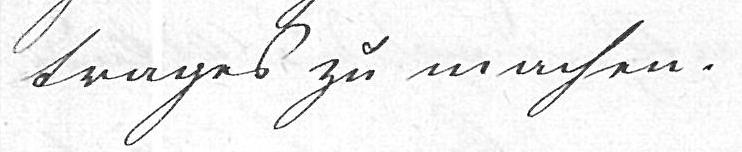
trages zu machen.
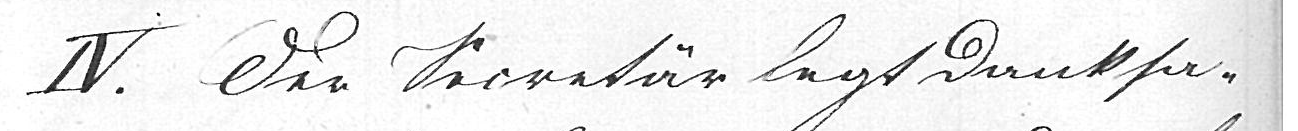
IV. Der Secretär legt Drucksa-
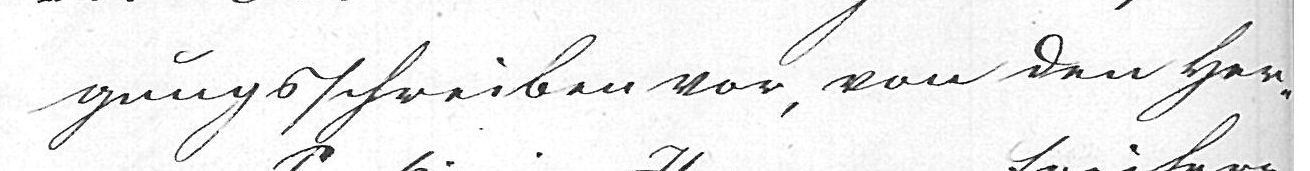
gungschreiben vor, von den Her-
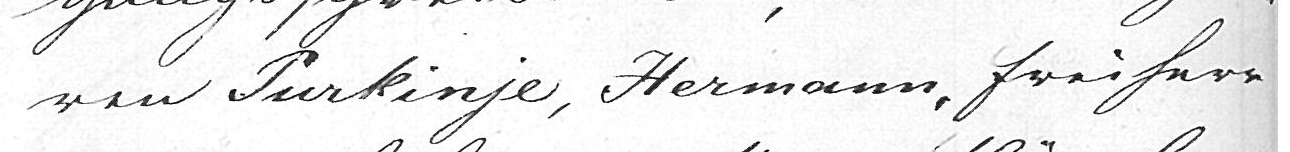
ren Purkinje, Hermann, Freiherr
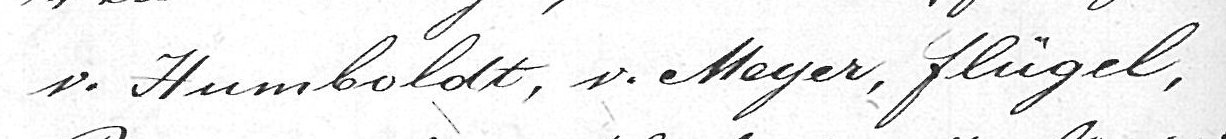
v. Humboldt, v. Meyer, Flügel,
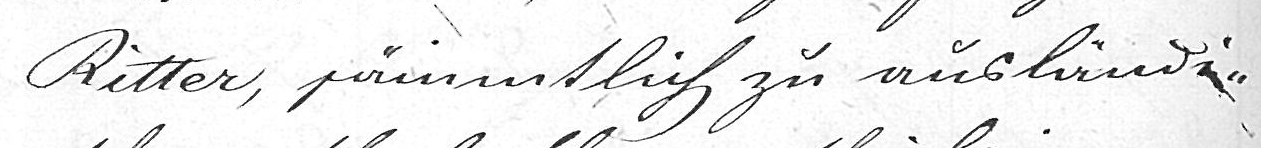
Ritter, sämmtlich zu ausländi-
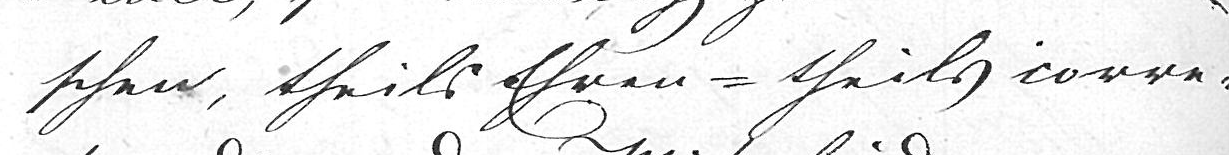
schen, theils Ehren- theils corre-
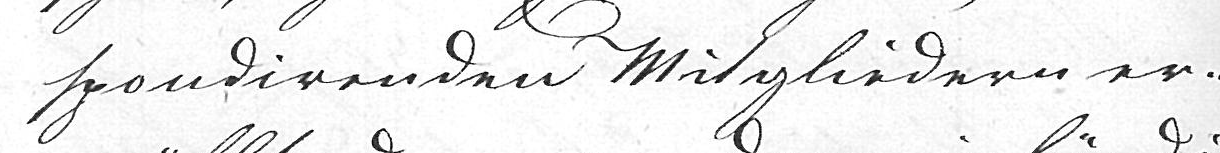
spondirenden Mitgliedern er-
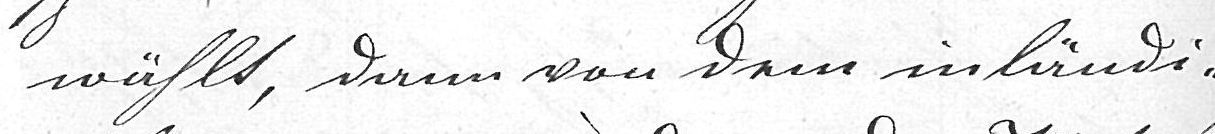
wählt, dann von dem inländi-
